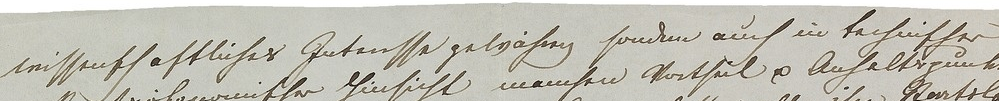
wissenschaftliches Interesse gewähren, sondern auch in technischer
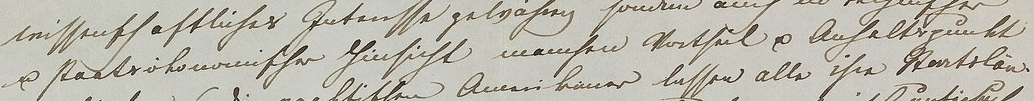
& staatsökonomischer Hinsicht manchen Vortheil & Anhaltspunkt
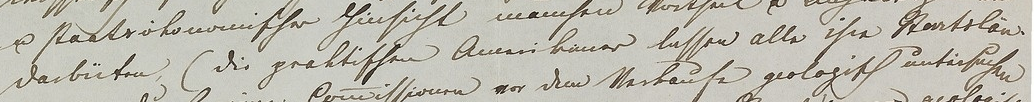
darbieten, (die praktischen Amerikaner lassen alle ihre Staatslän-
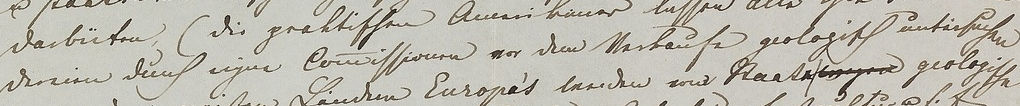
dereien durch eigne Commissionen vor dem Verkaufe geologisch untersuchen
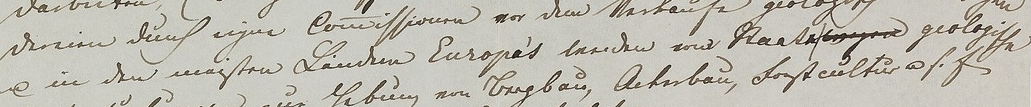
& in den meisten Ländern Europa's werden vom Staate geologische
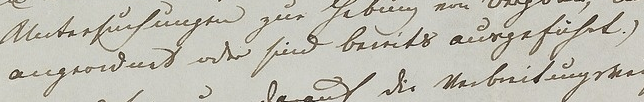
angeordnet oder sind bereits ausgeführt.)
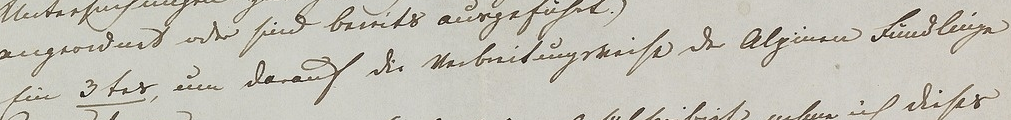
Ein 3tes, um darauf die Verbreitungsweise der Alpinen Fündlinge
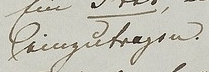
einzutragen.
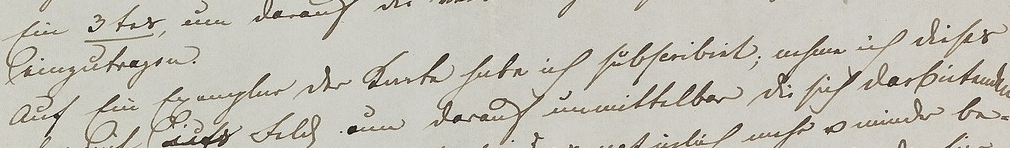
Auf Ein Exemplar der Karte habe ich subscribirt, nehme ich dieses
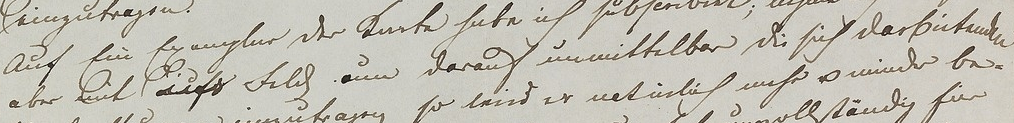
aber mit aufs Feld um darauf unmittelbar die sich darbietenden
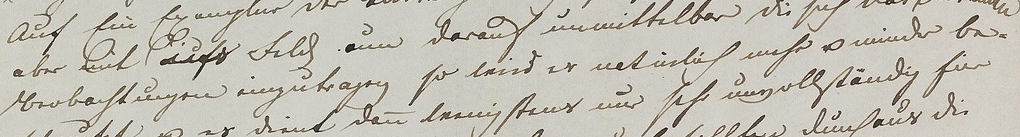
Beobachtungen einzutragen, so wird es natürlich mehr & minder be-
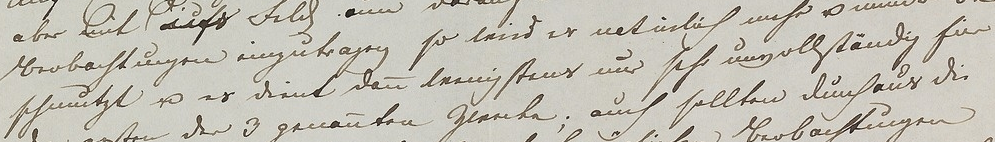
schmutzt & es dient dann wenigstens nur sehr unvollständig für
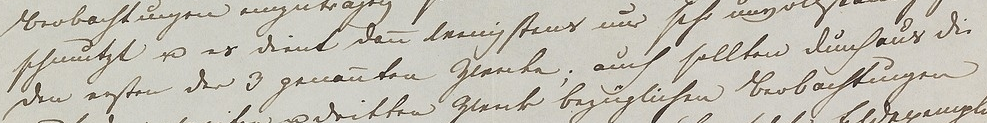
den ersten der 3 genannten Zwecke; auch sollten durchaus die
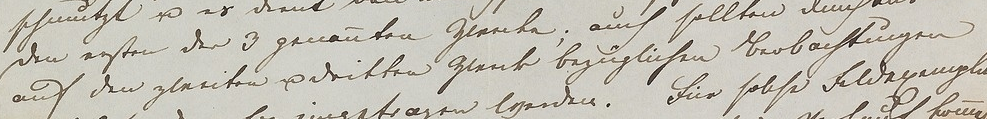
auf den zweiten & dritten Zweck bezüglichen Beobachtungen
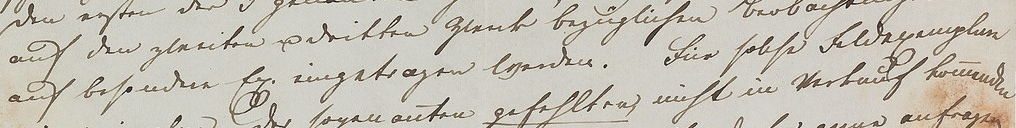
auf besondere Exp. eingetragen werden. Für solche Feldexemplare
